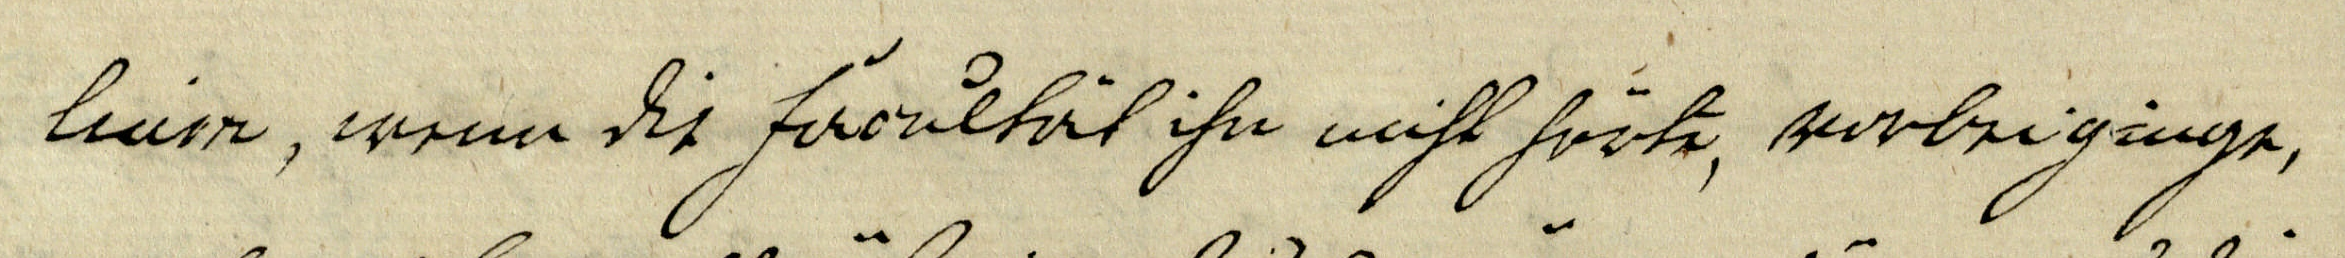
lium, wenn die Facultät ihn nicht hörte, vorbeiginge,
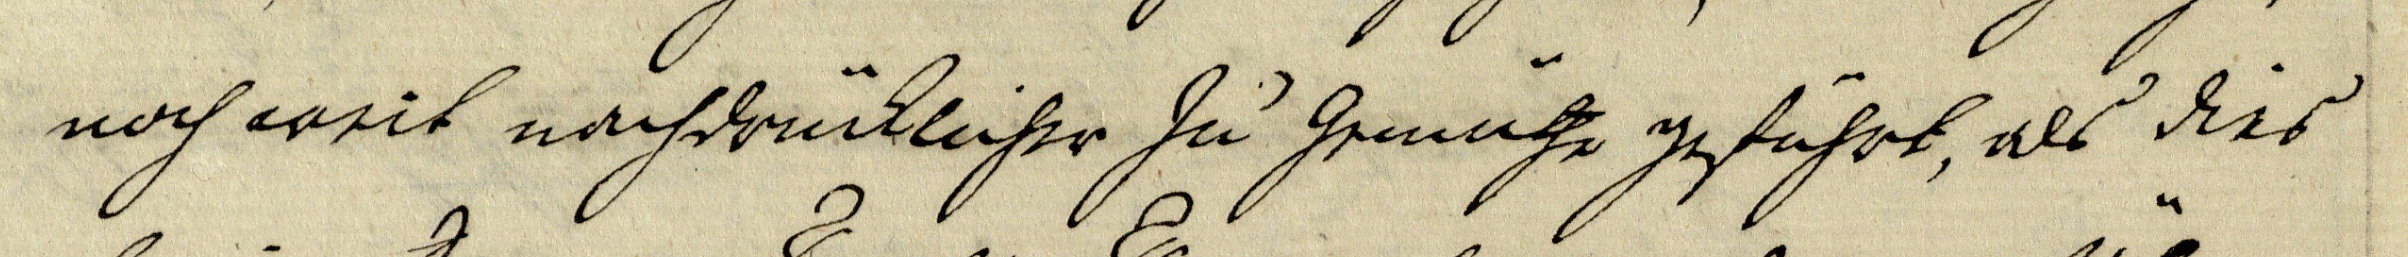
noch weit nachdrücklicher zu Gemüthe geführt, als dies
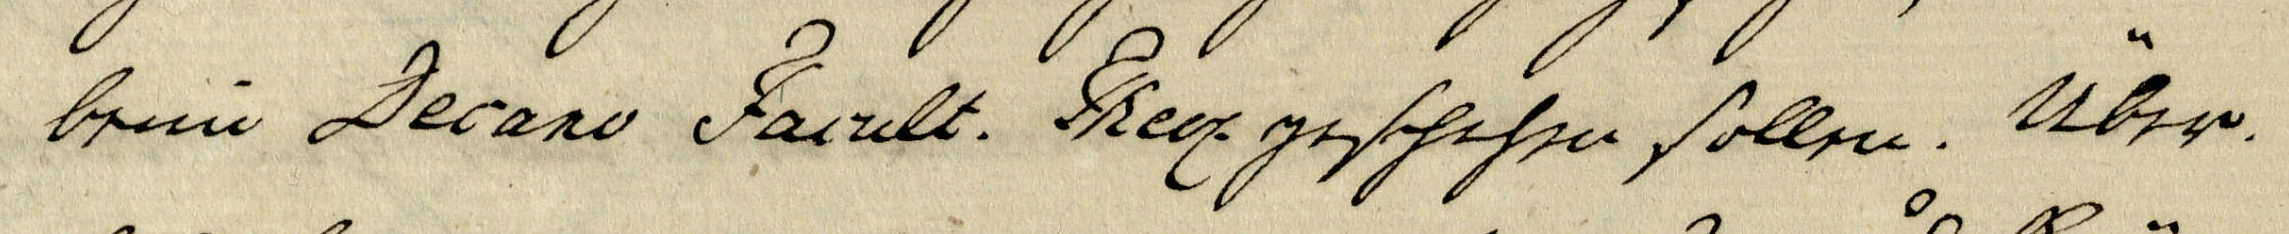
beim Decano Facult. Theol. geschehen sollen. Über¬
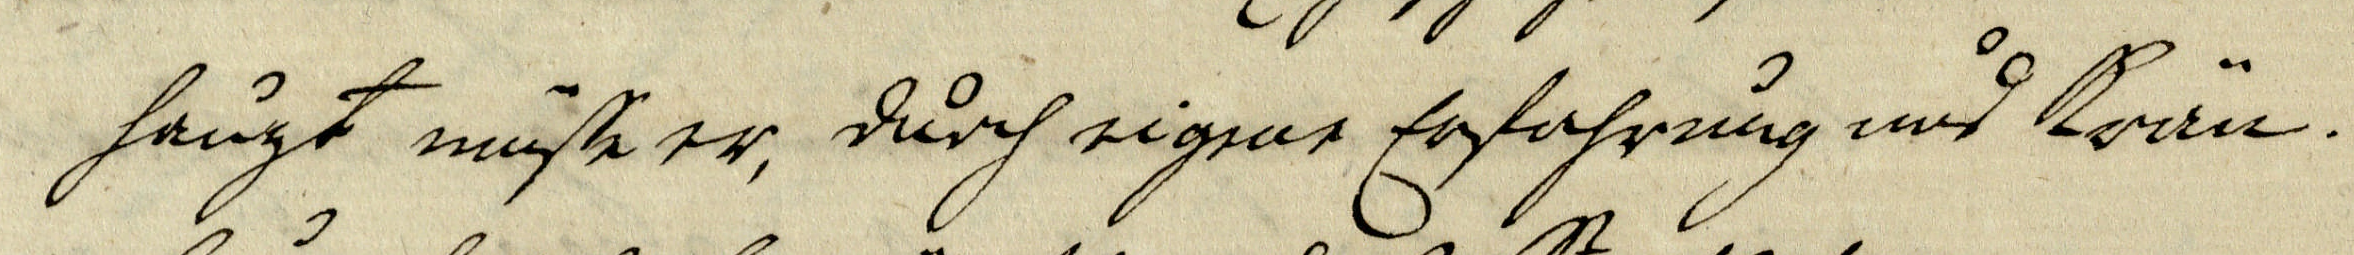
haupt müsse er, durch eigene Erfahrung und Krän¬
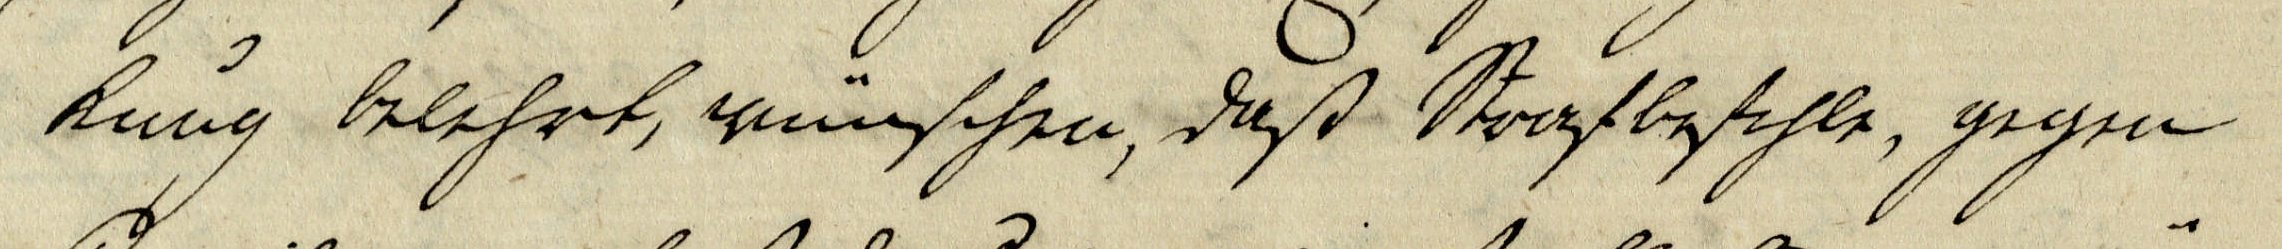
kung belehrt, wünschen, daß Strafbefehle, gegen
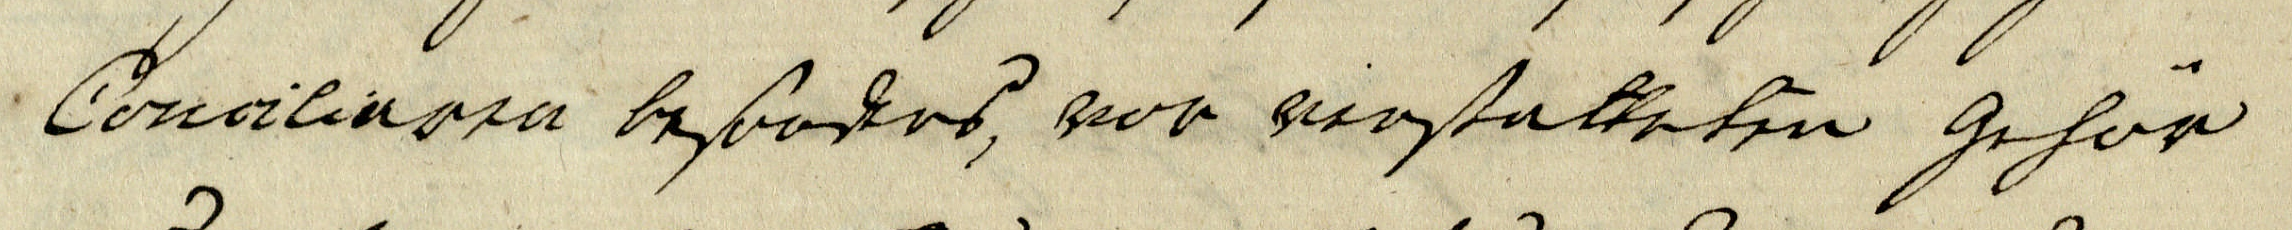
Conciliaren besonders, vor verstattetem Gehör
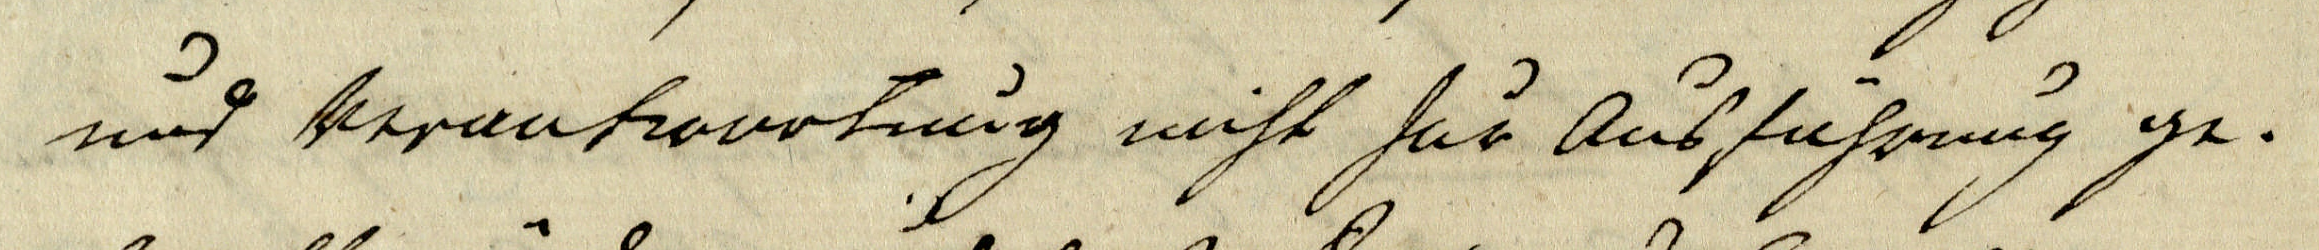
und Verantwortung nicht zur Ausführung ge¬
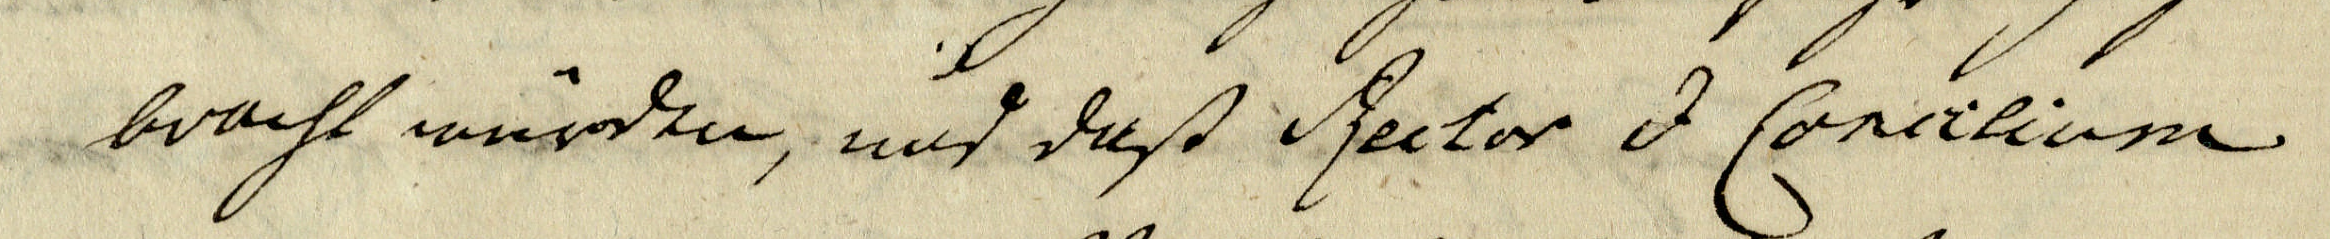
bracht würden, und daß Rector et Concilium
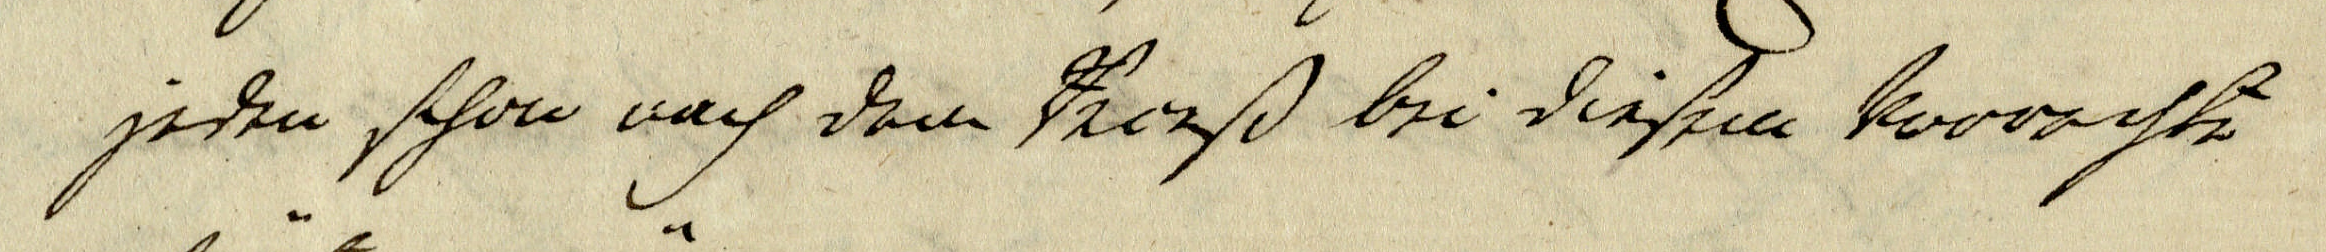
jeden schon nach dem Receß bei diesem Vorrechte
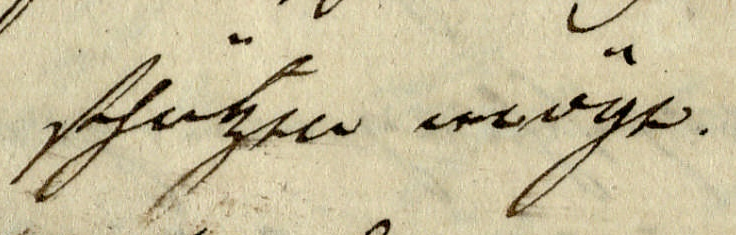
schützen möge.
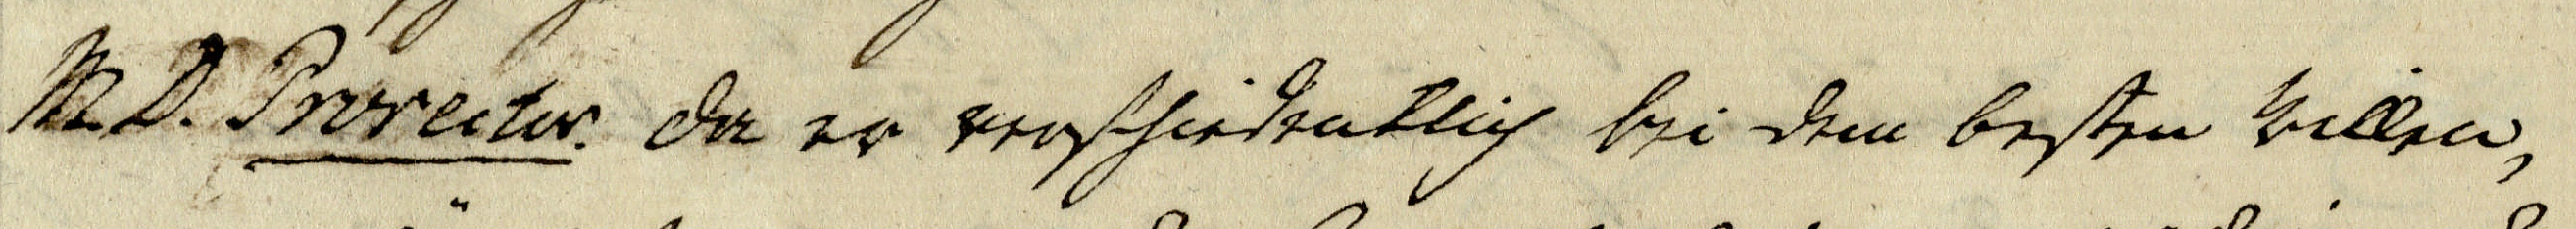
M. D. Prorector Da er verschiedentlich bei dem besten Willen,
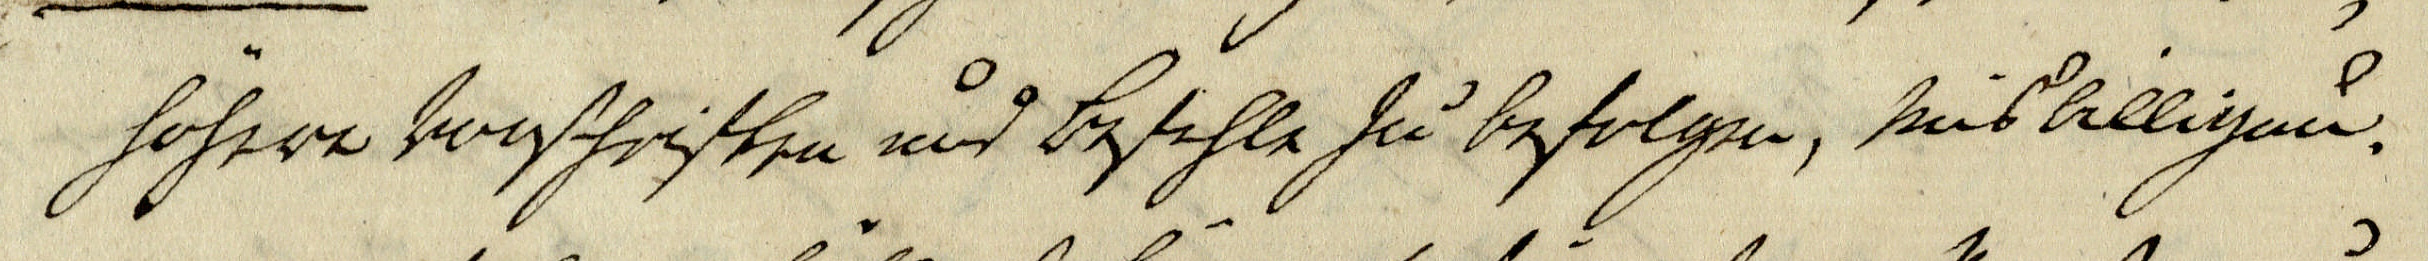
höhere Vorschriften und Befehle zu befolgen, Misbilligun¬
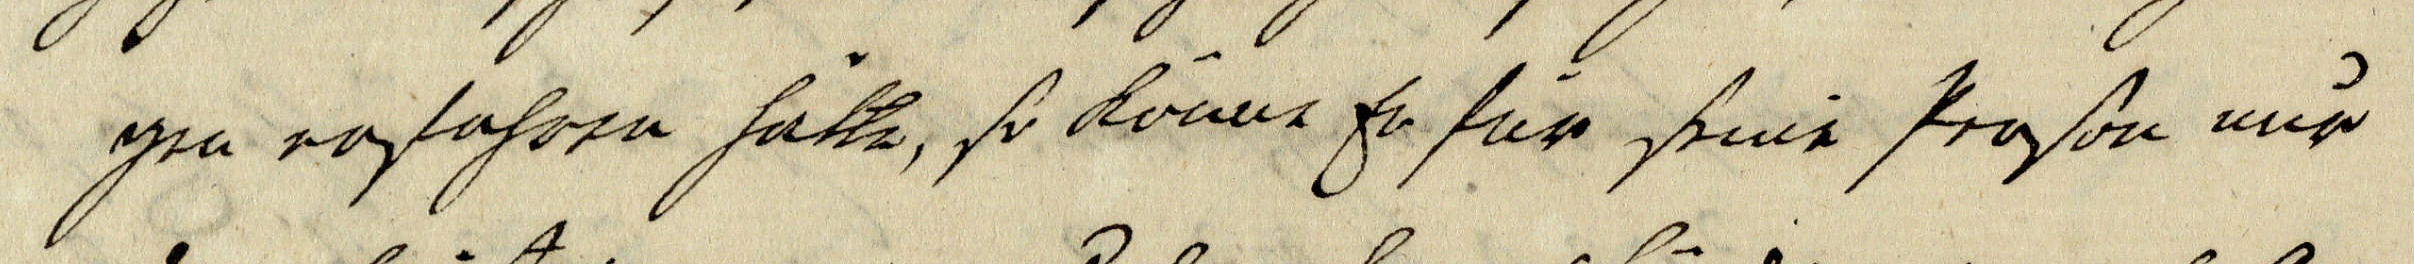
gen erfahren hätte, so könne Er für seine Person nur
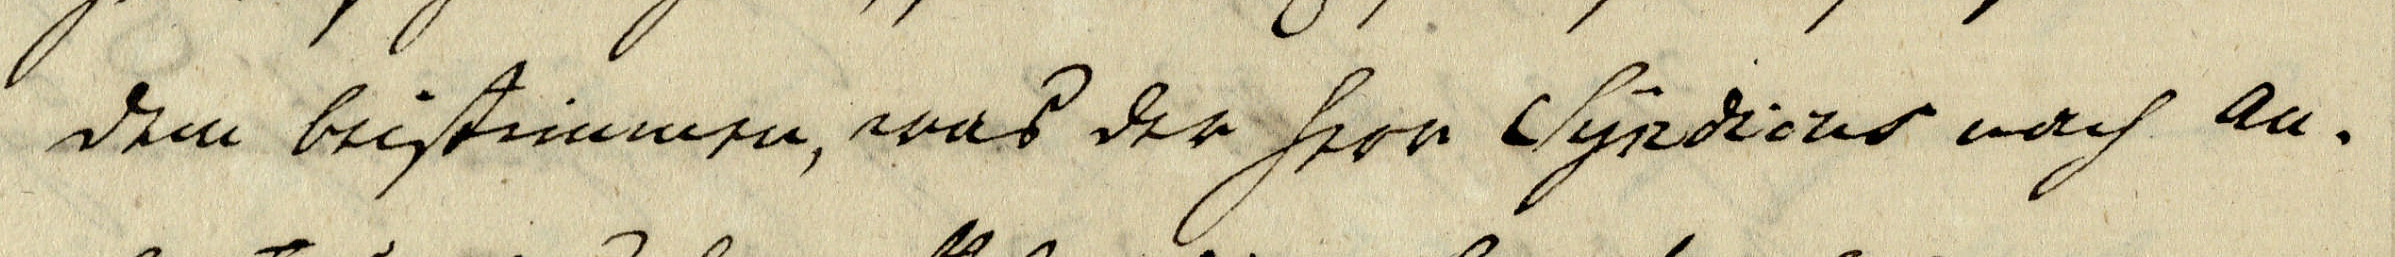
dem beistimmen, was der Herr Sÿndicus nach An¬
